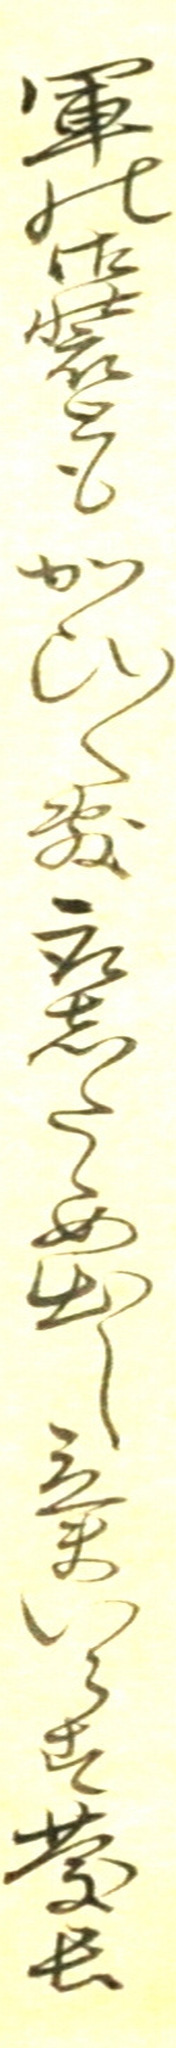軍の御装ともかひ〳〵敷取したゝめ出し立まいらす慶長
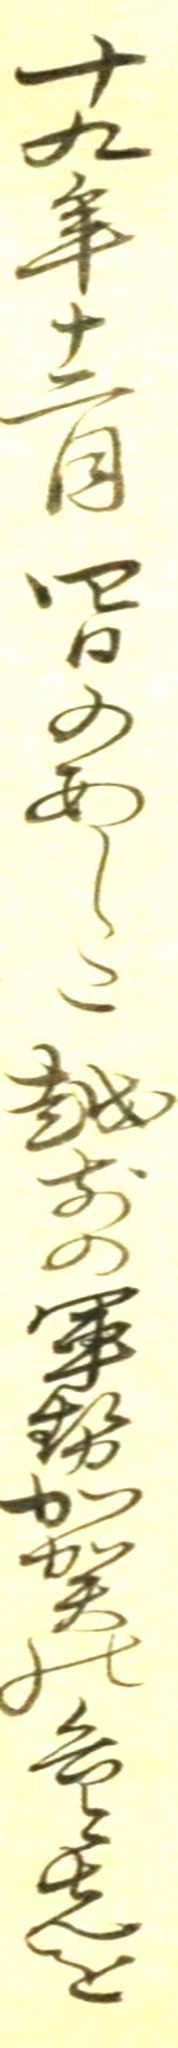十九年十二月四日のあした越前の軍勢加賀の兵と先を
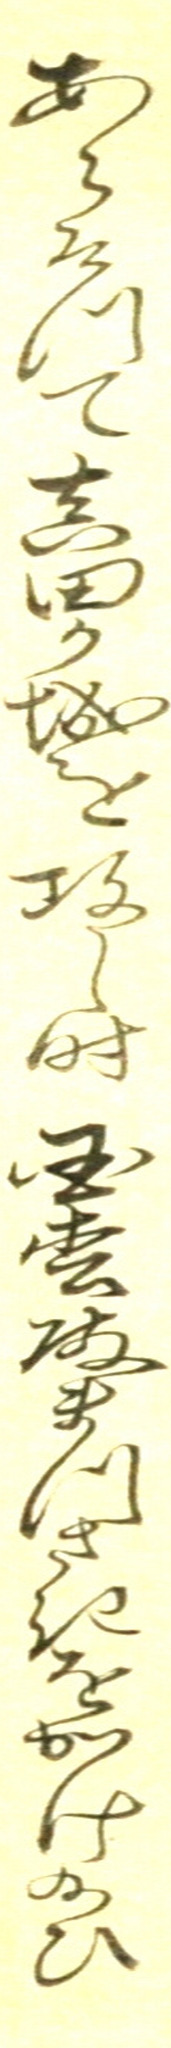あらそつて真田か城を攻し時国松殿まつさきをかけ給ひ
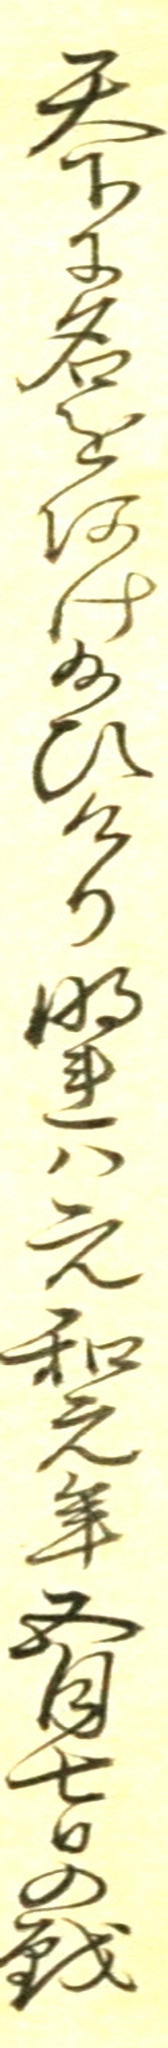天下に名をあけ給ひけり明れは元和元年五月七日の戦
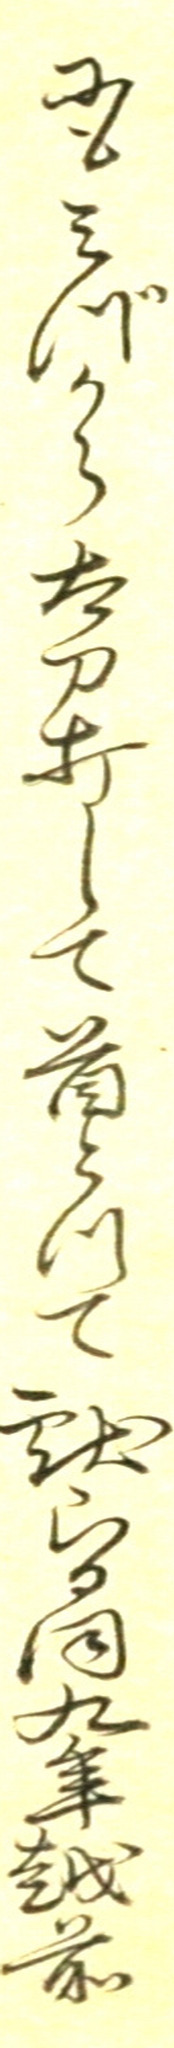にもみづから太刀打して首とつて献らる同九年越前
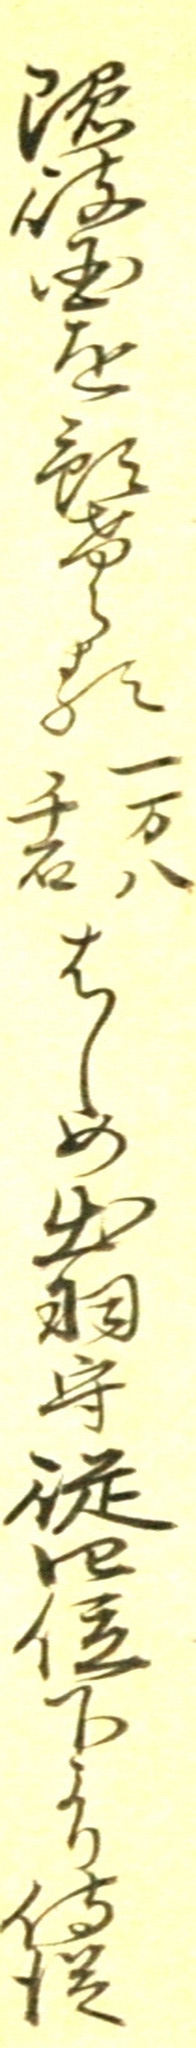隠岐国を預けらる一万八千石はしめ出羽守従四位下より侍従
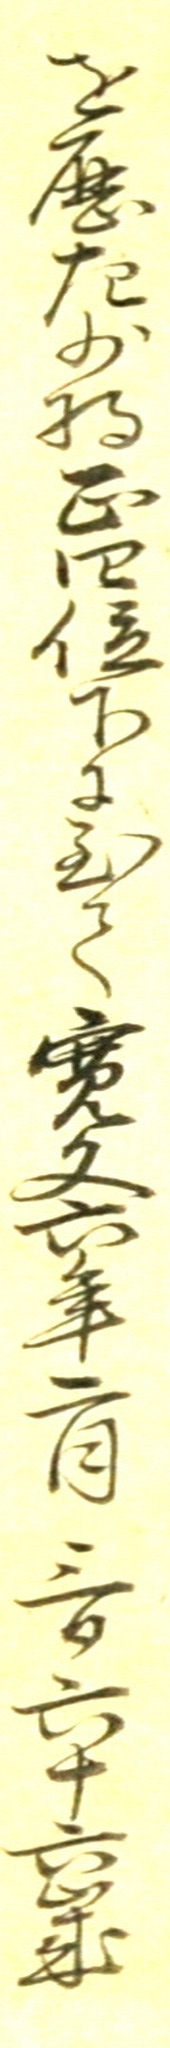を歴左少将正四位下に至て寛文六年二月三日六十六歳

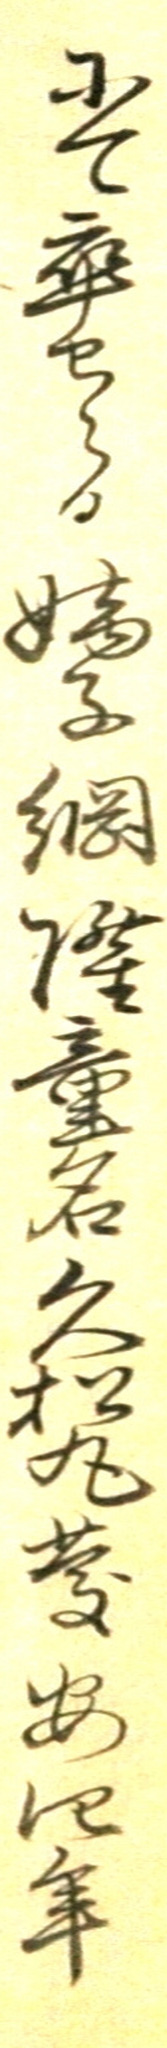にて卒せらる嫡子綱隆童名久松丸慶安四年
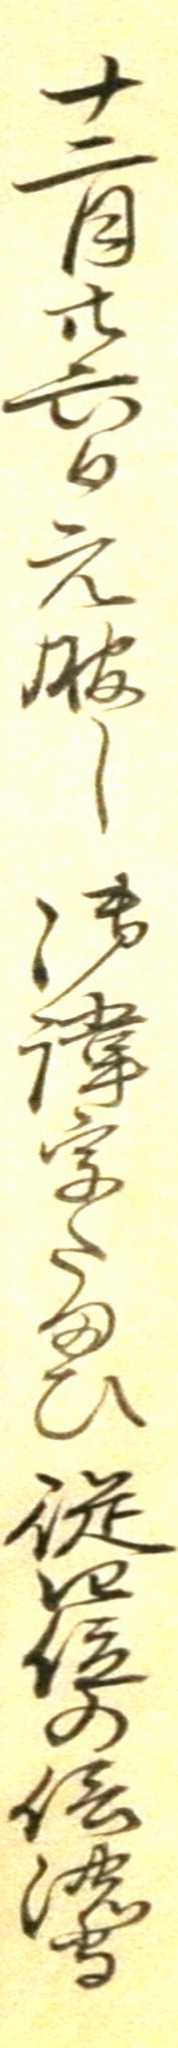十二月廿六日元服し御諱字たまひ従四位の信濃守
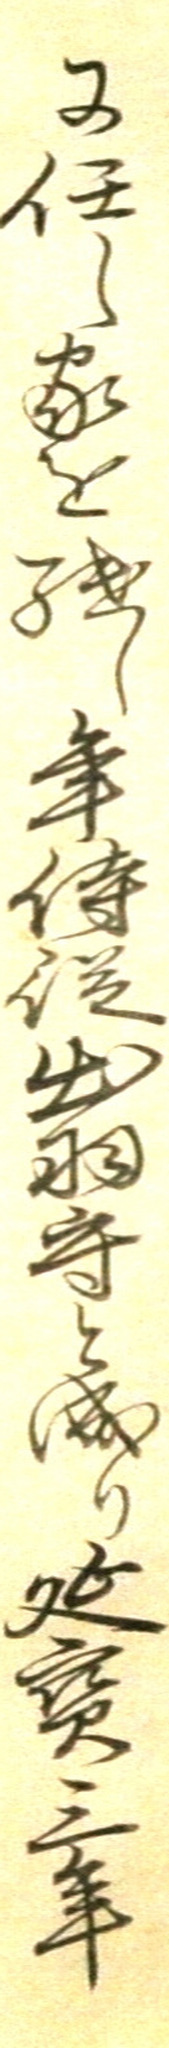に任し家を継し事侍従出羽守と成り延宝三年
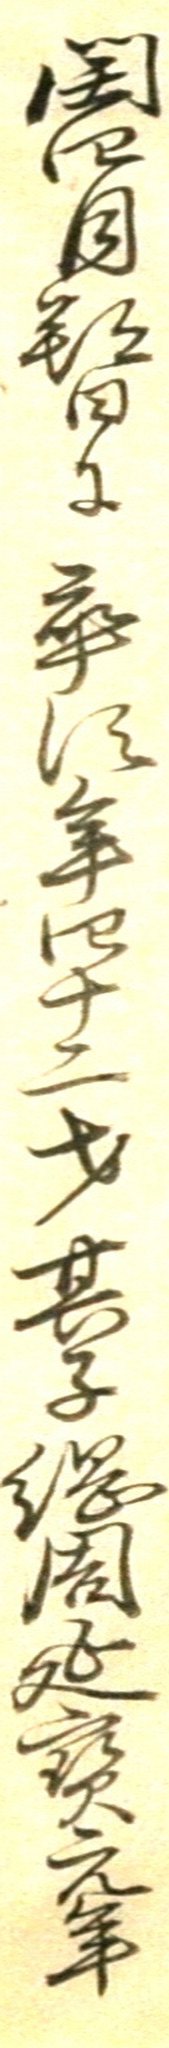閏四月朔日に卒す年四十二才其子綱周延宝元年
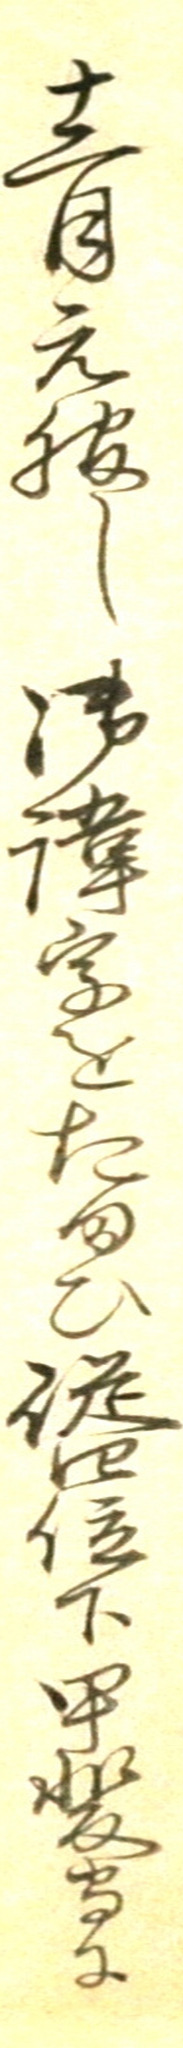十二月元服し御諱字をたまひ従四位下甲斐守に
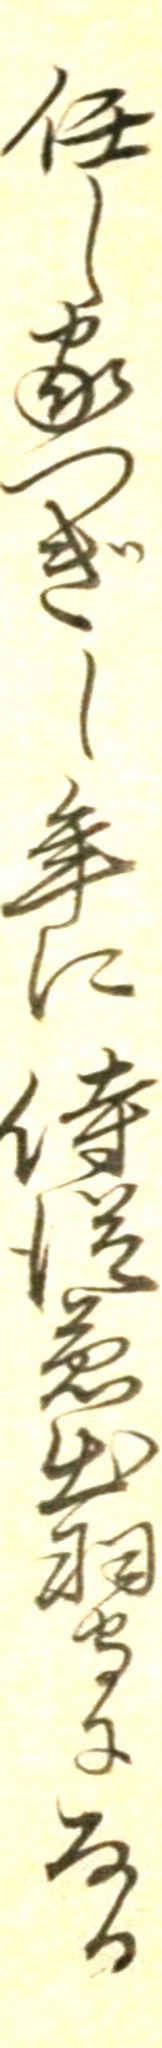任し家つぎし年に侍従兼出羽守になる
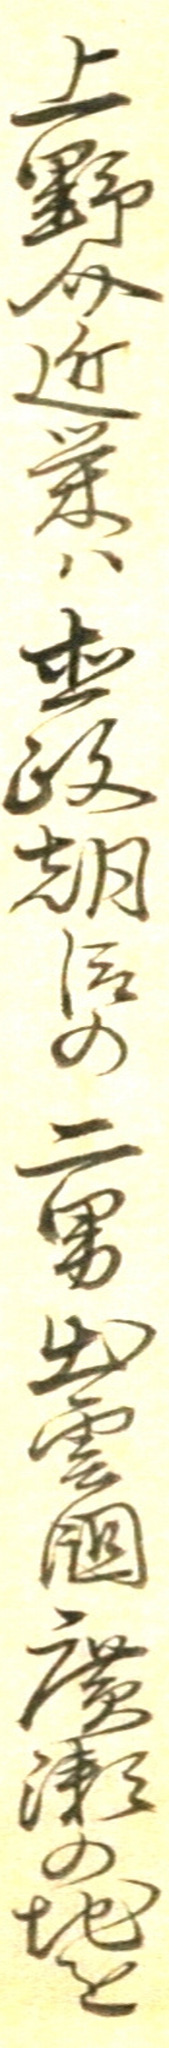上野介近栄は直政朝臣の二男出雲国広瀬の地を
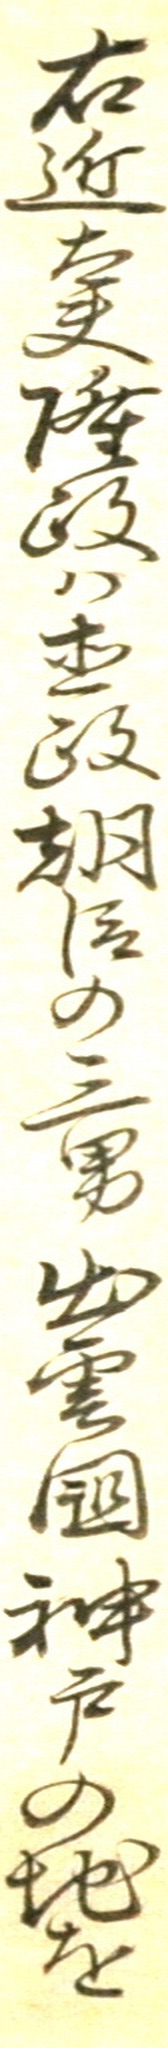右近太夫隆政は直政朝臣の三男出雲国神戸の地を
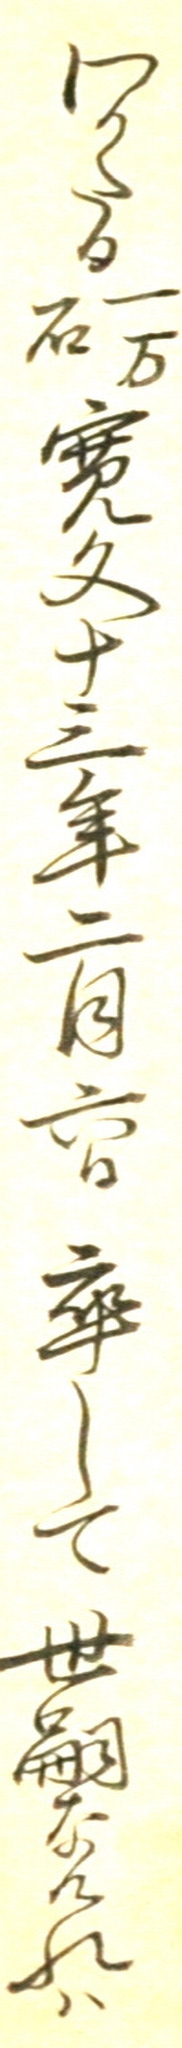わかたる一万石寛文十三年二月六日卒して世嗣なけれは
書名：藩翰譜（一）
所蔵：伊那市立高遠町図書館・合同会社AMANE
